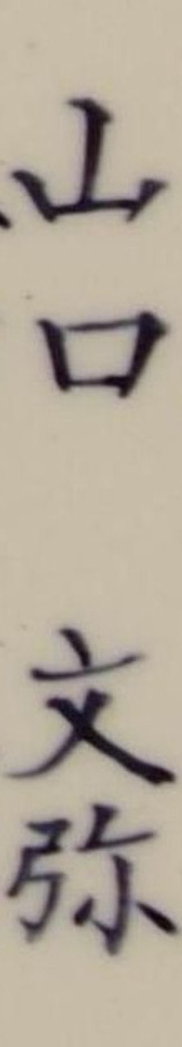山口文弥
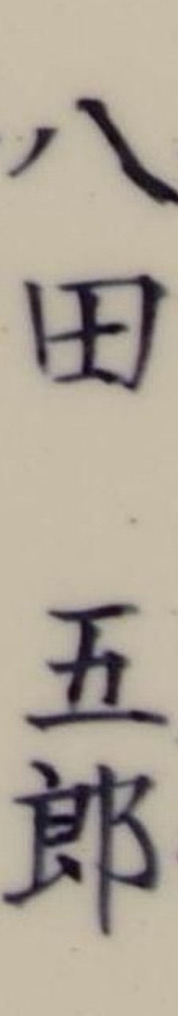八田五郎
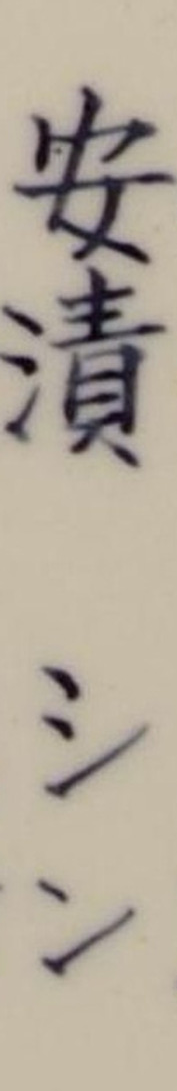安漬シン
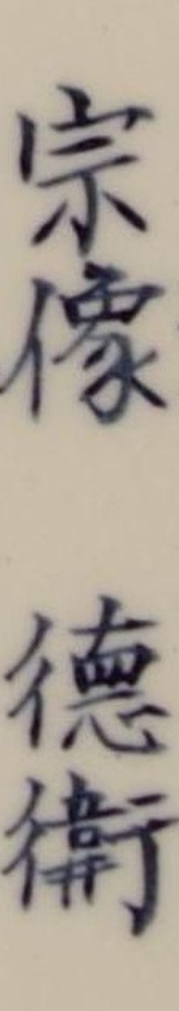宗像徳衡
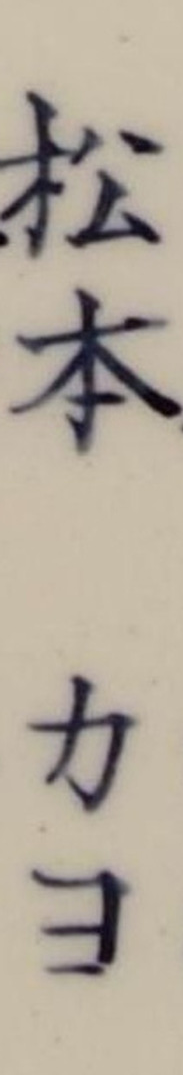松本カヨ
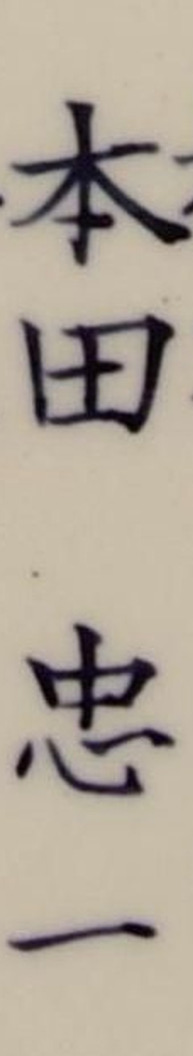本田忠一
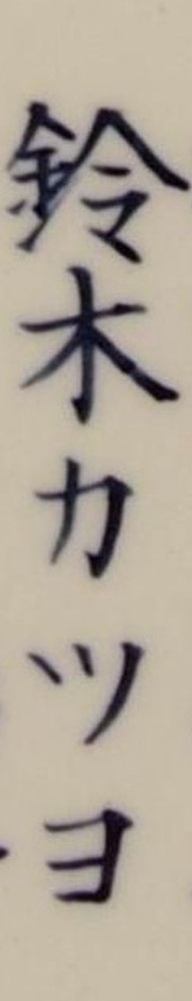鈴木カツヨ
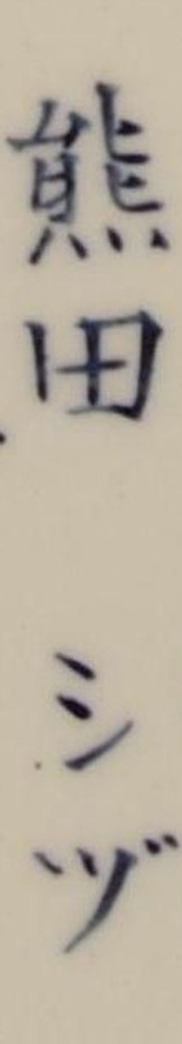熊田シヅ
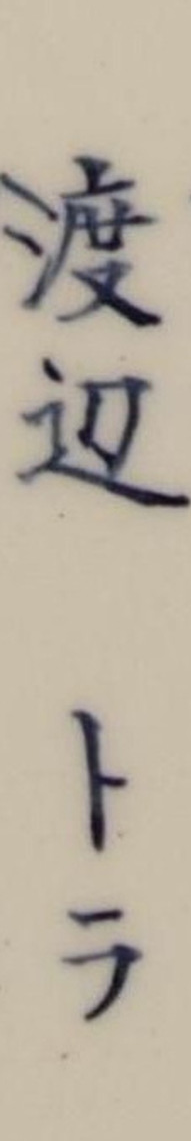渡辺トラ
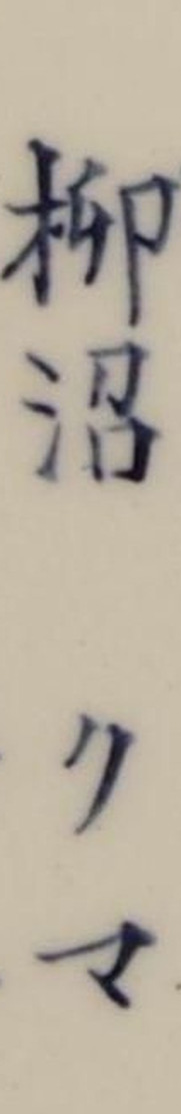柳沼クマ
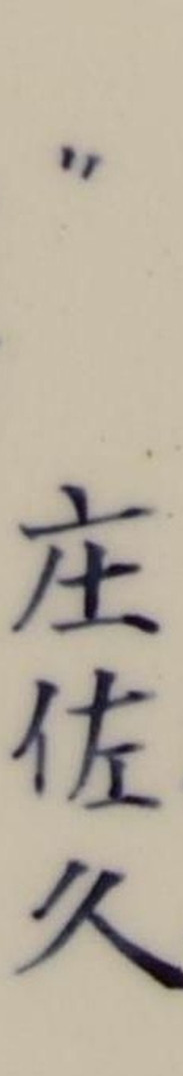庄佐久
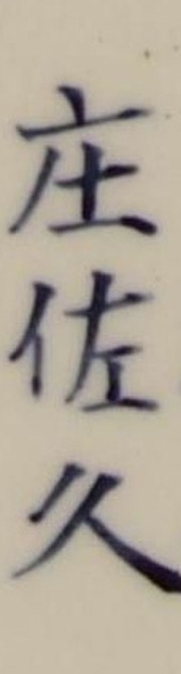庄佐久
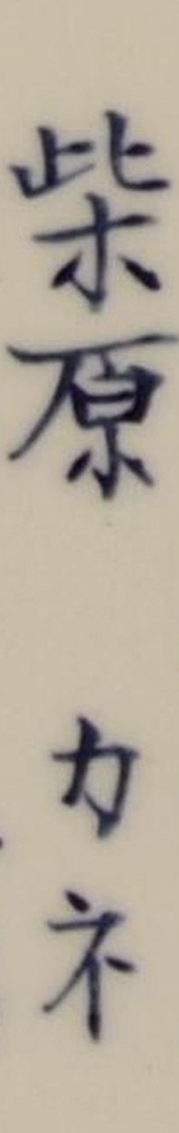柴原力ネ
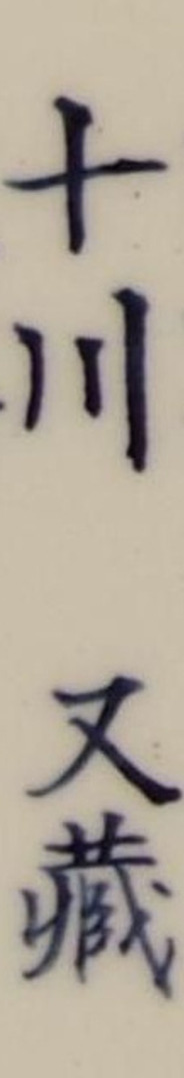十川又蔵
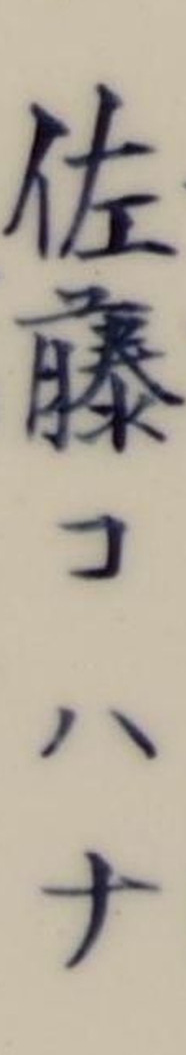佐藤コハナ
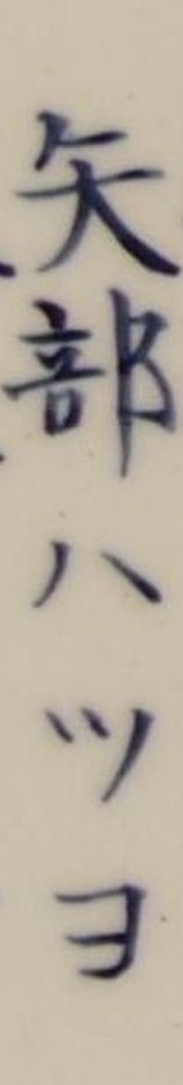矢部ハツヨ
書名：E~L
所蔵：高野山金剛峯寺
